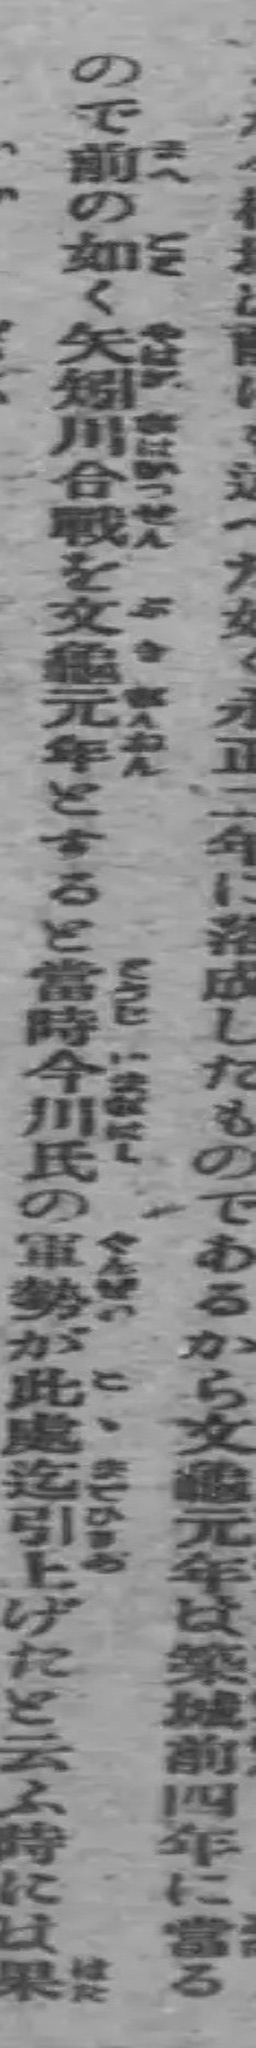ので前の如く矢矧川合戦を文亀元年とすると当時今川氏の軍勢が此処迄引上げたと云ふ時には果
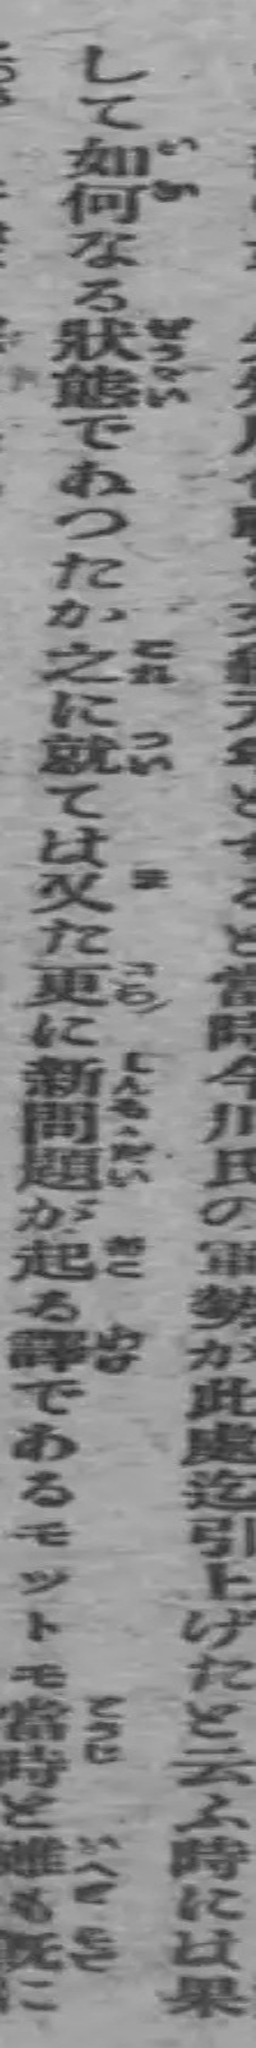して如何なる状態であつたか之に就ては又た更に新問題が起る訳であるモツトモ当時と雖も既に
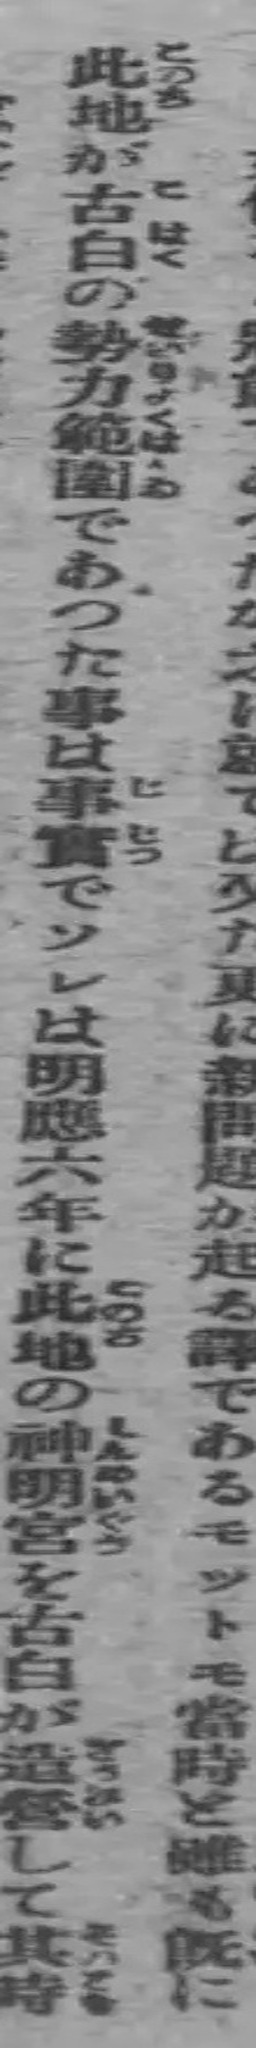此地が古白の勢力範囲であつた事は事実でソレは明応六年に此地の神明宮を古白が造営して其時
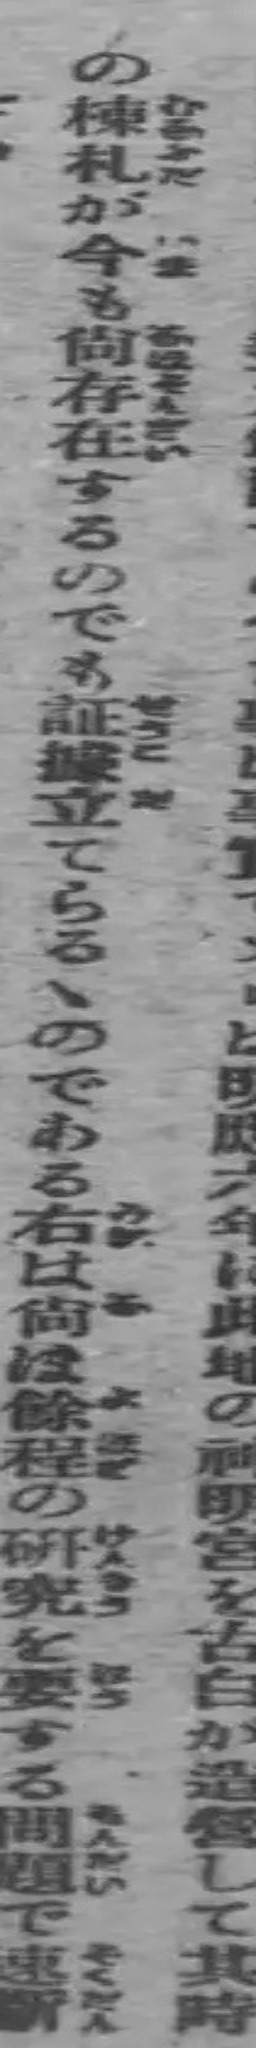の棟札が今も尚存在するのでも証拠立てらるゝのである右は尚ほ余程の研究を要する問題で速断
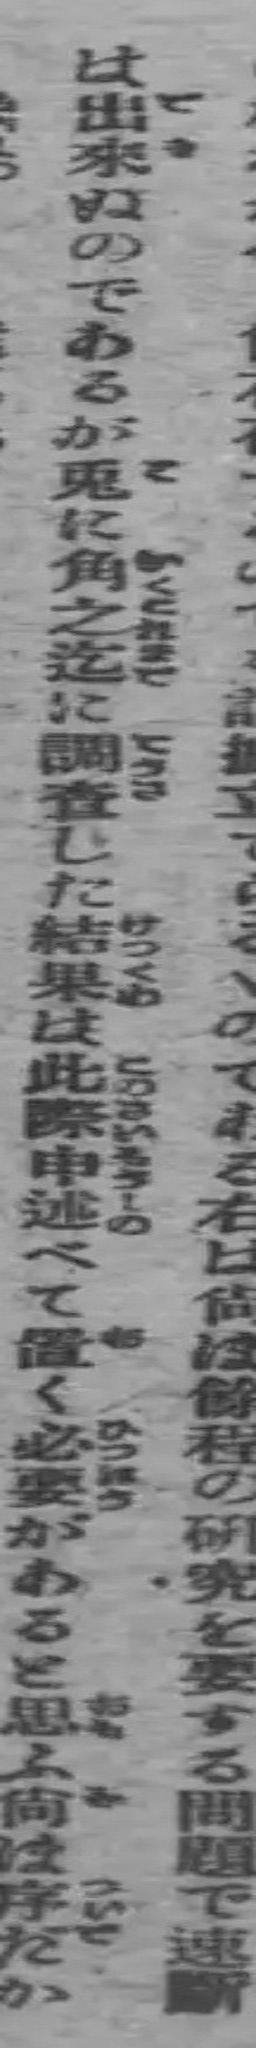は出来ぬのであるが兎に角之迄に調査した結果は此際申述べて置く必要があると思ふ尚ほ序だか
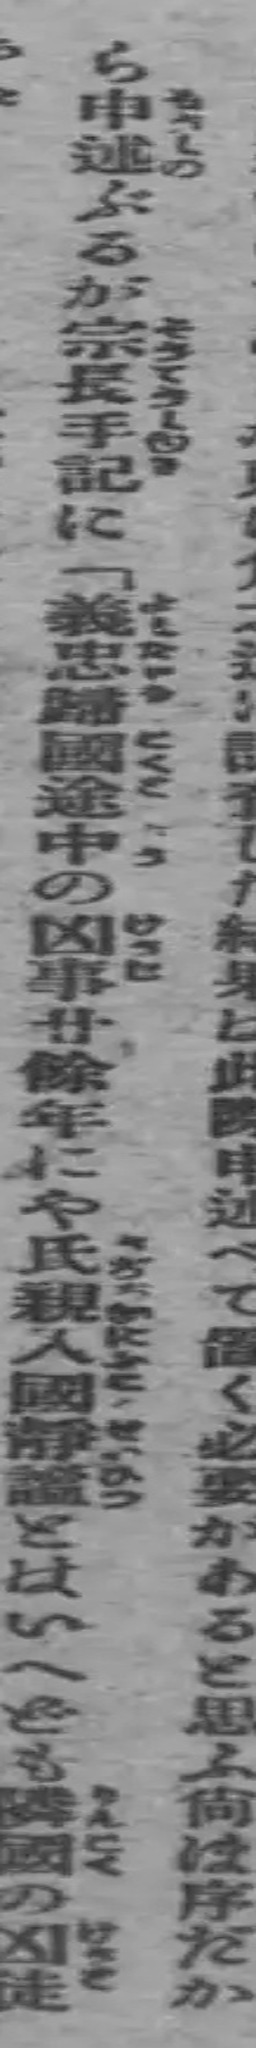ら申述ぶるが宗長手記に「義忠帰国途中の凶事廿余年にや氏親入国静謐とはいへども隣国の凶徒
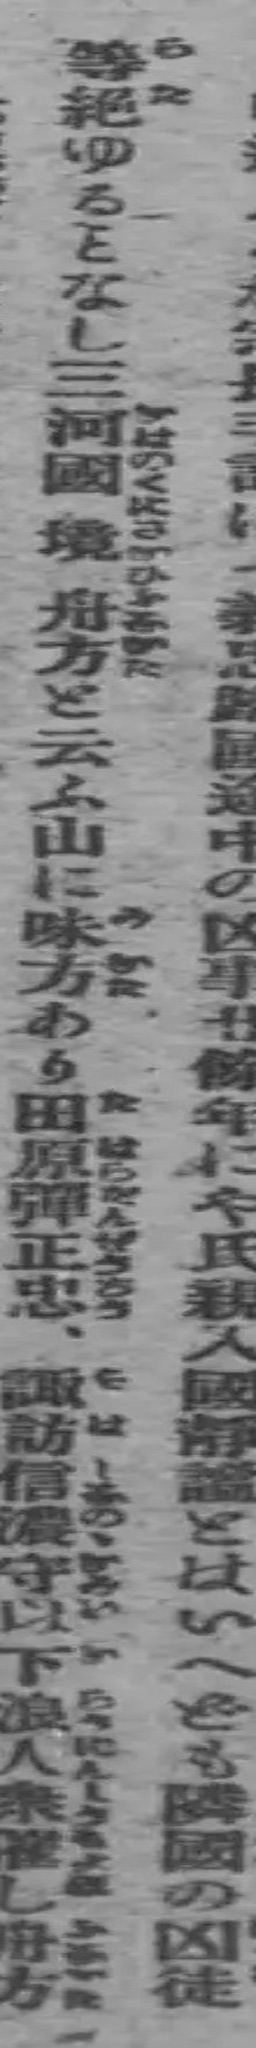等絶ゆることなし三河国境舟方と云ふ山に味方あり田原弾正忠、諏訪信濃守以下浪人衆催し舟方
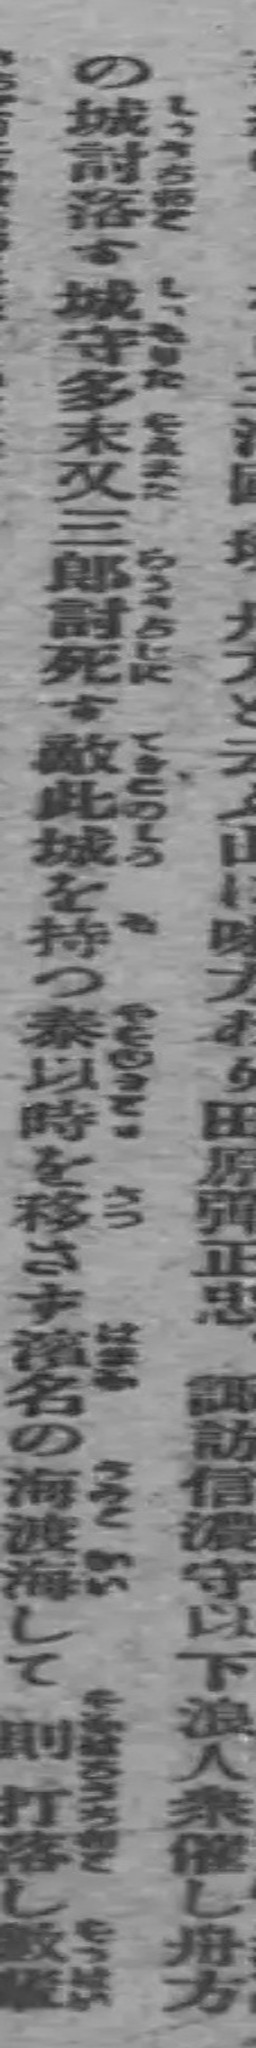の城討落す城守多末又三郎討死す敵此城を持つ泰以時を移さず浜名の海渡海して則打落し数輩
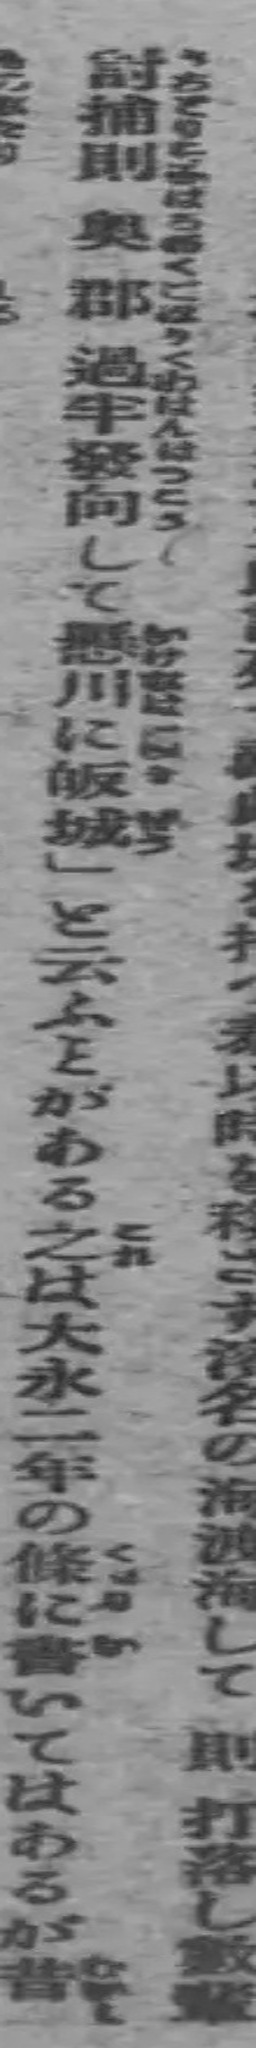討捕則奥郡過半発向して懸川に皈城」と云ふことがある之は大永二年の条に書いてはあるが昔
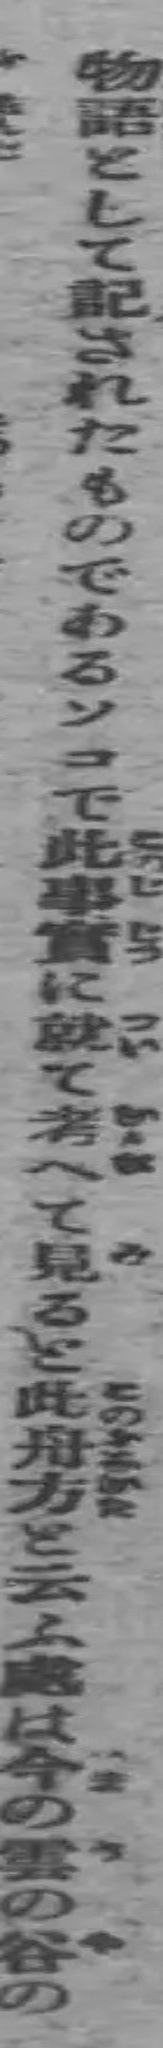物語として記されたものであるソコで此事実に就て考へて見ると此舟方と云ふ処は今の雲の谷の
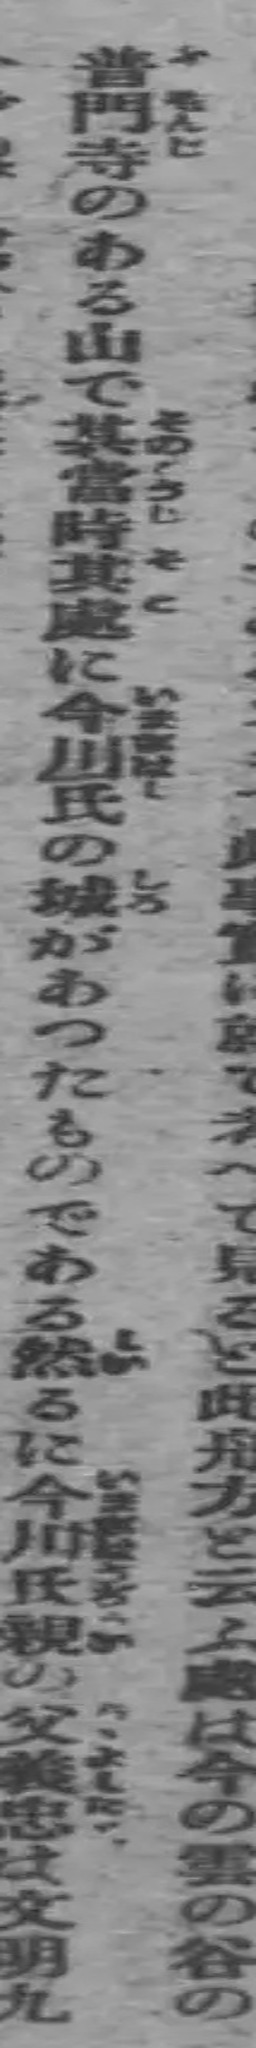普門寺のある山で其当時其処に今川氏の城があつたものである然るに今川氏親の父義忠は文明九
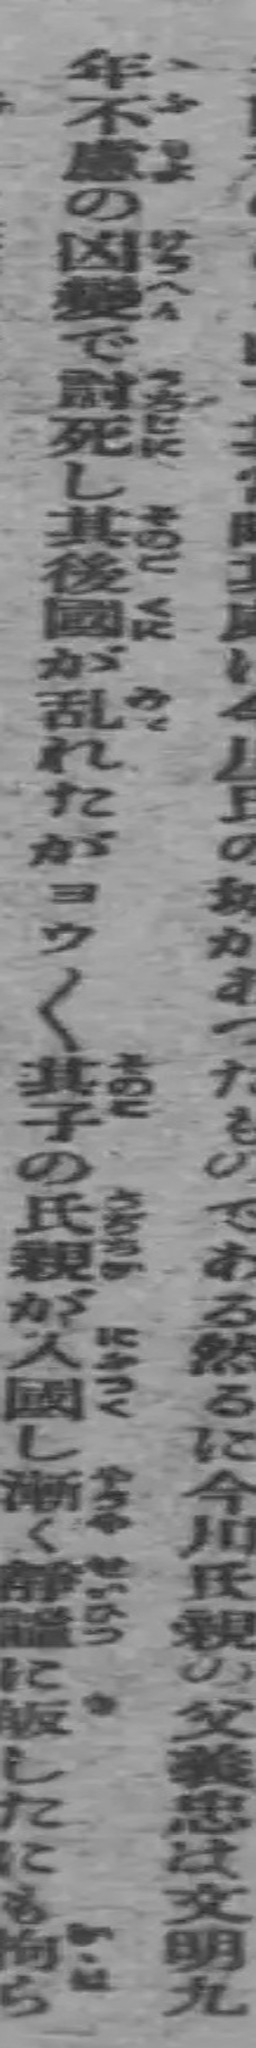年不慮の凶変で討死し其後国が乱れたがヨウ〳〵其子の氏親が入国し漸く静謐に皈したにも拘ら
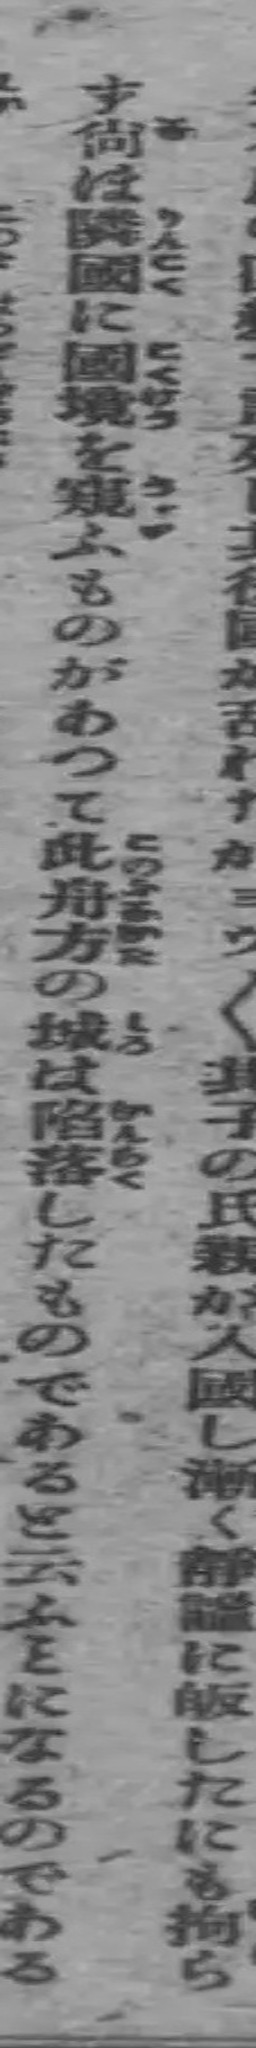ず尚ほ隣国に国境を窺ふものがあつて此舟方の城は陥落したものであると云ふことになるのである
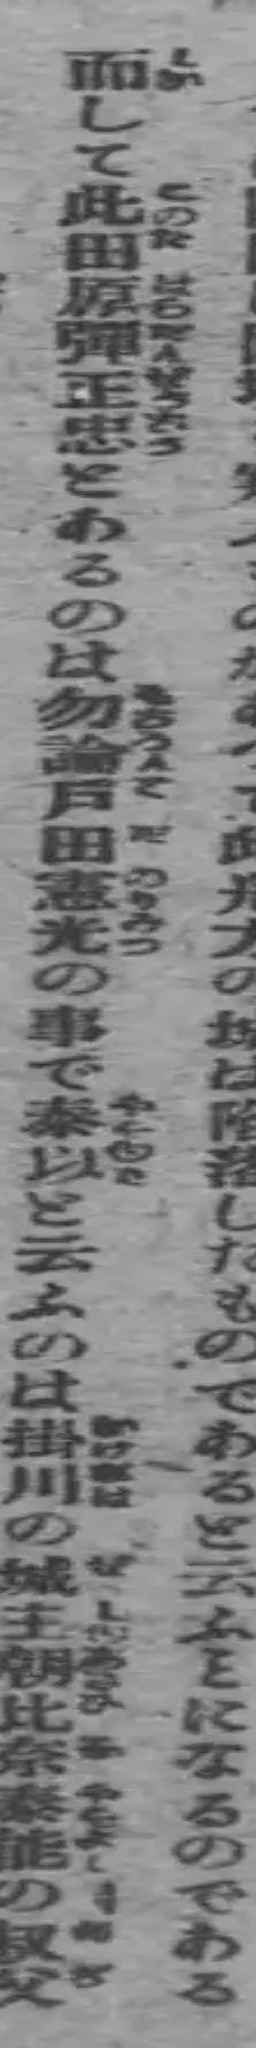而して此田原弾正忠とあるのは勿論戸田憲光の事で泰以と云ふのは掛川の城主朝比奈泰能の叔父
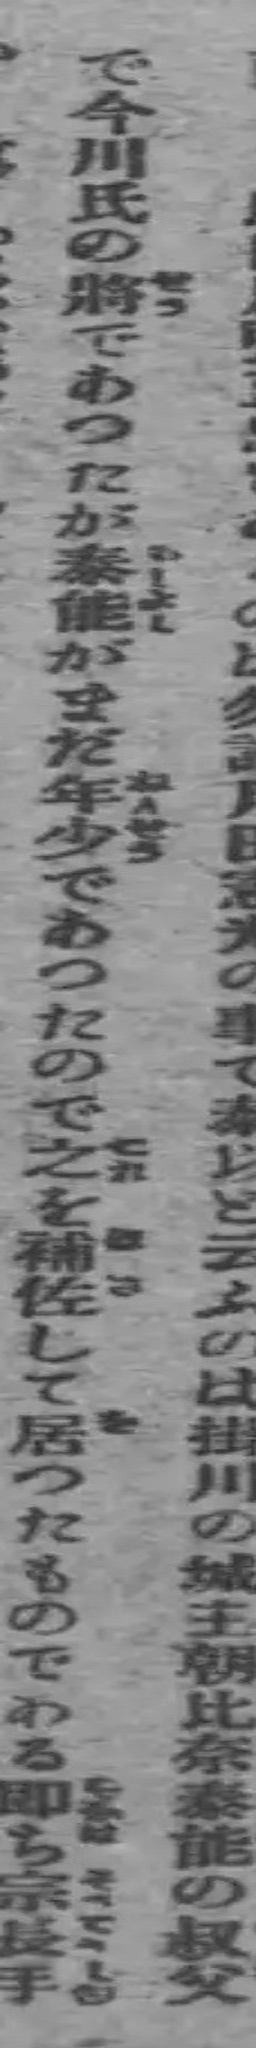で今川氏の将であつたが泰能がまだ年少であつたので之を補佐して居つたものである即ち宗長手
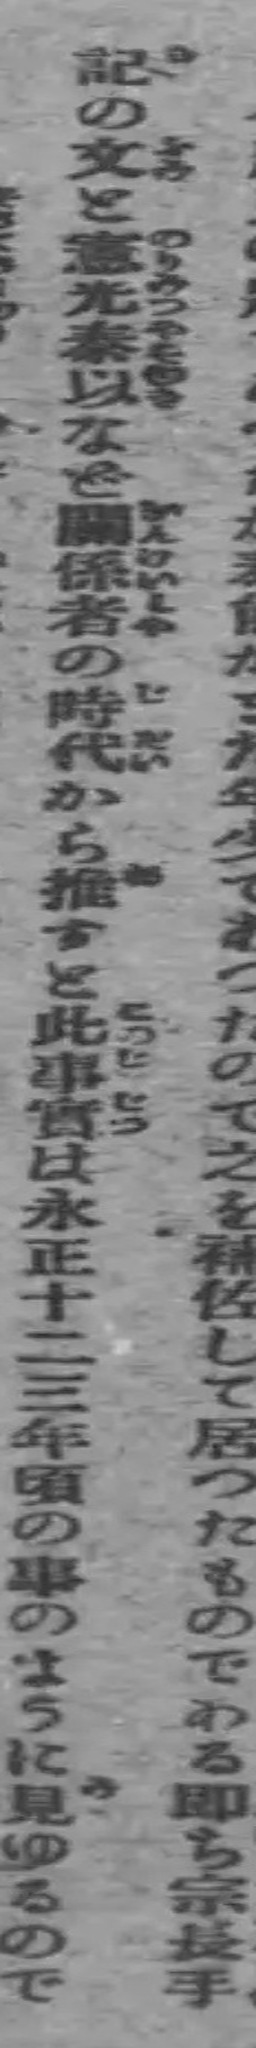記の文と憲光泰以など関係者の時代から推すと此事実は永正十二三年頃の事のように見ゆるので
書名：豊橋市史談
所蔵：国立国会図書館 National Diet Library, JAPAN
